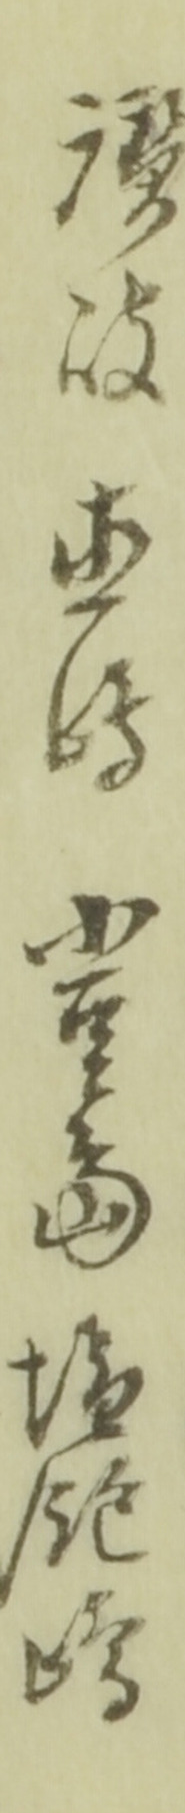讃岐直島小豆島塩飽島
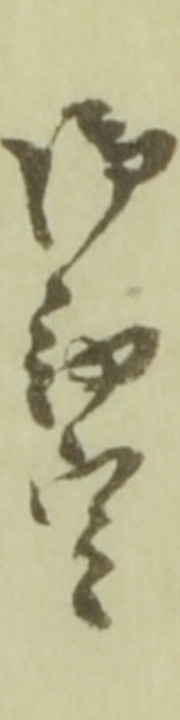御勤定
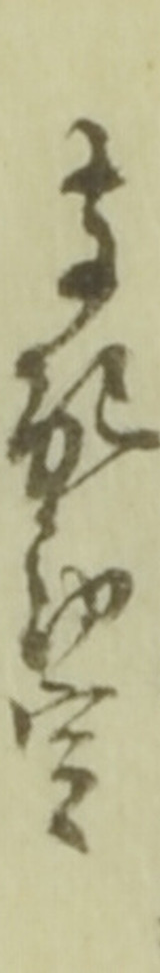支配決定
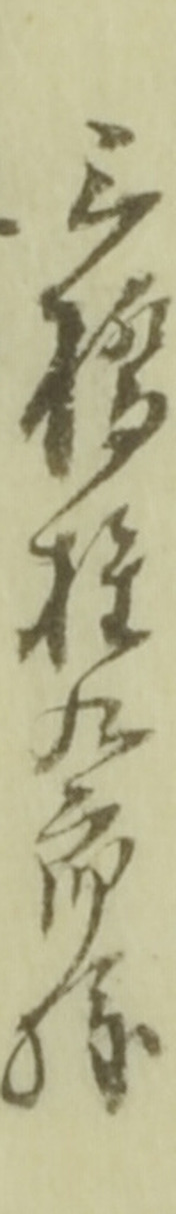三橋権九郎様
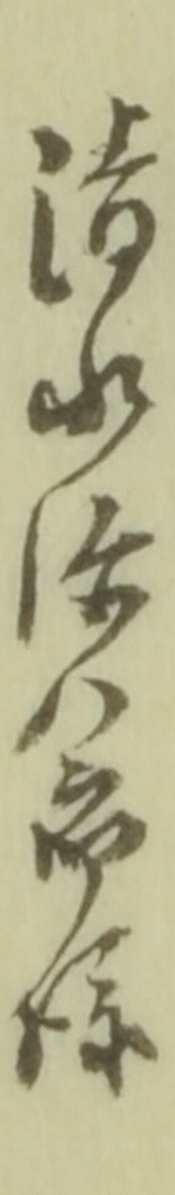清水現八郎様
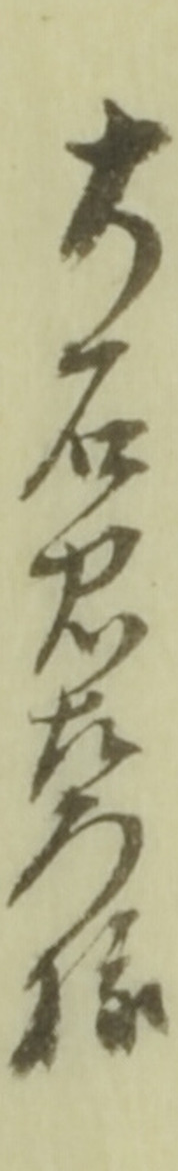大石忠左衛門様
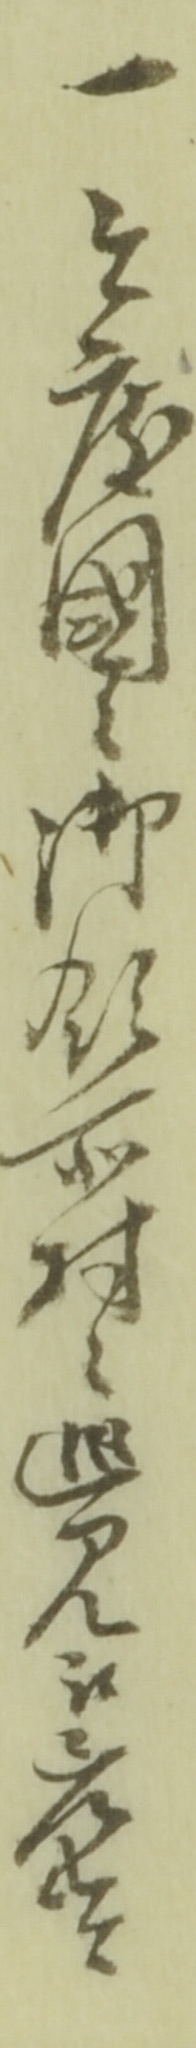一今度国之御領所村之巡見被差異
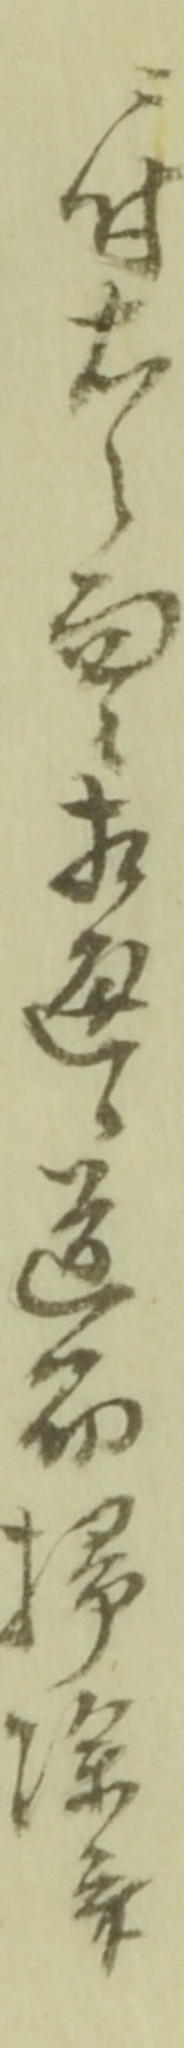二付右之面々相通候道筋掃除並
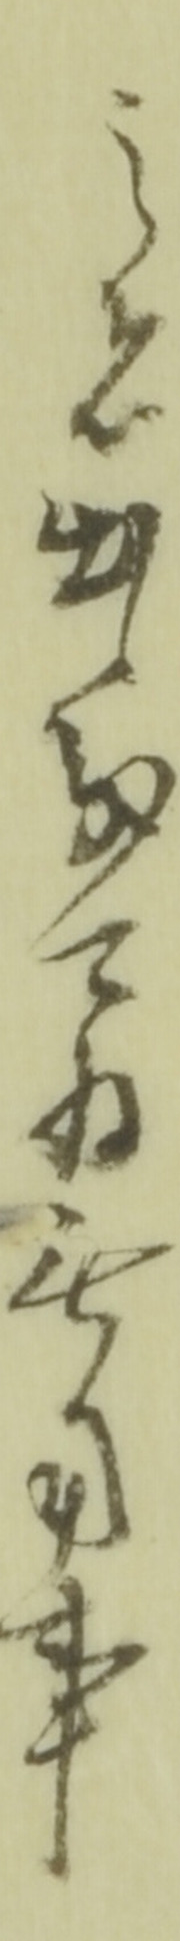之者出候義可為無用事
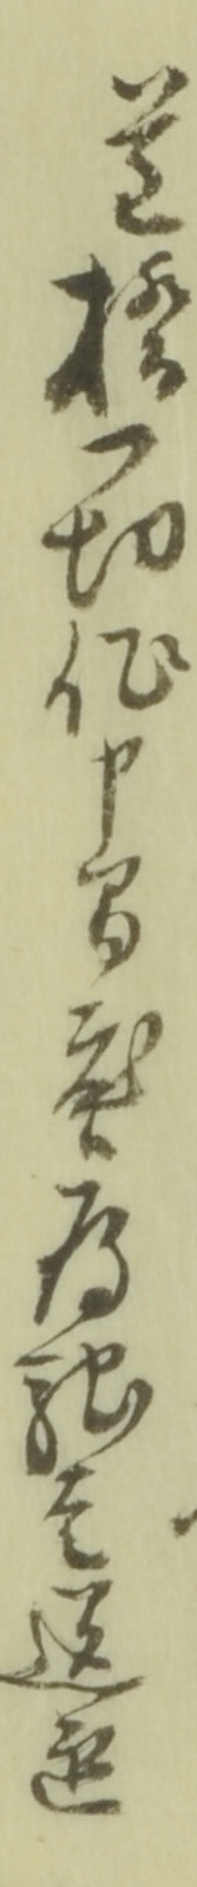道橋一切作申間敷候為馳走送迎
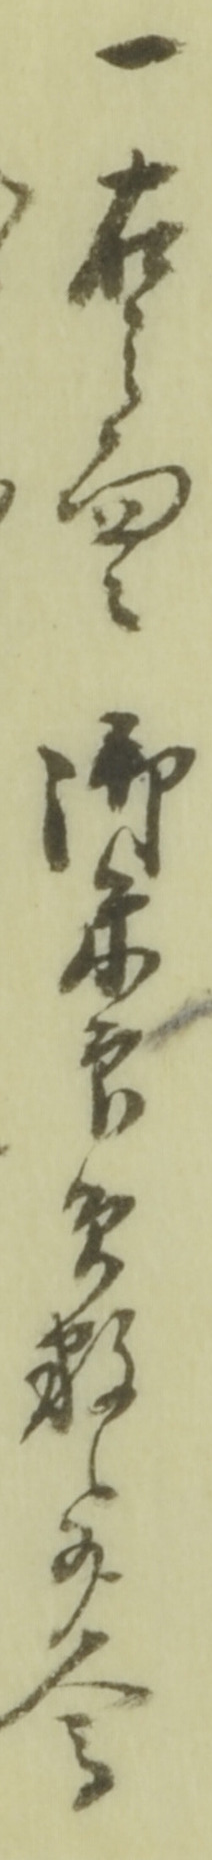一右之面々御朱印員数之外人馬
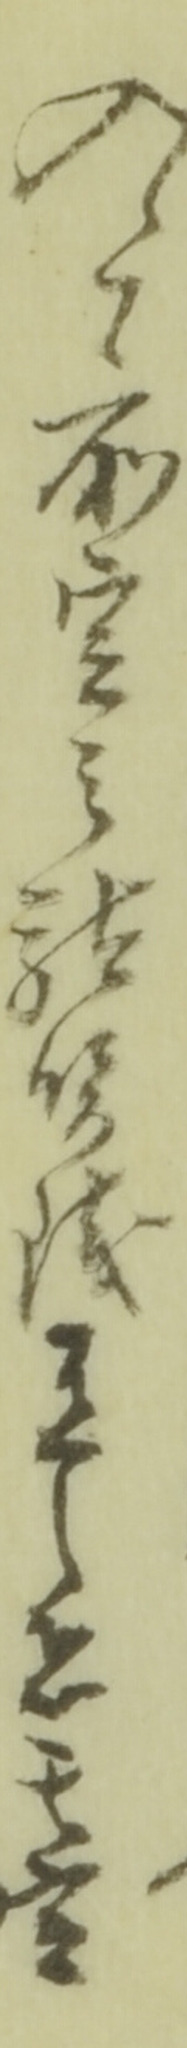入候て所定之諸賃銭有之者其定
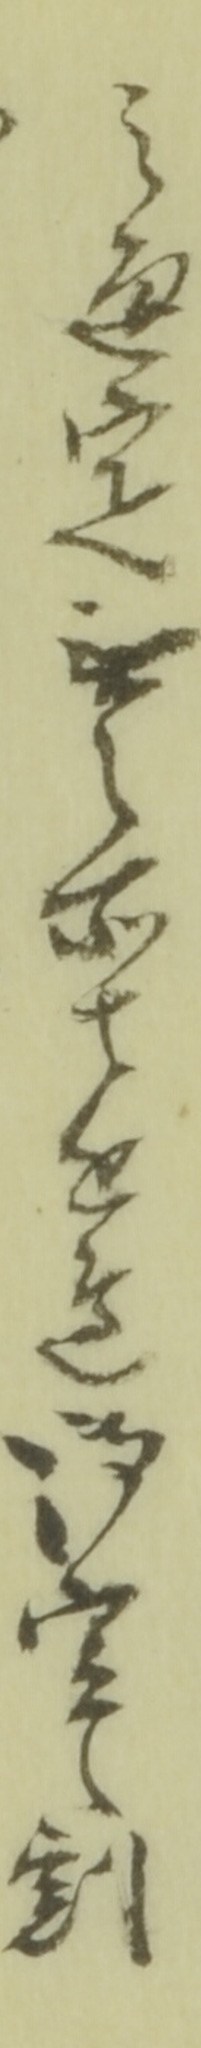之通定無之所者近辺室之割
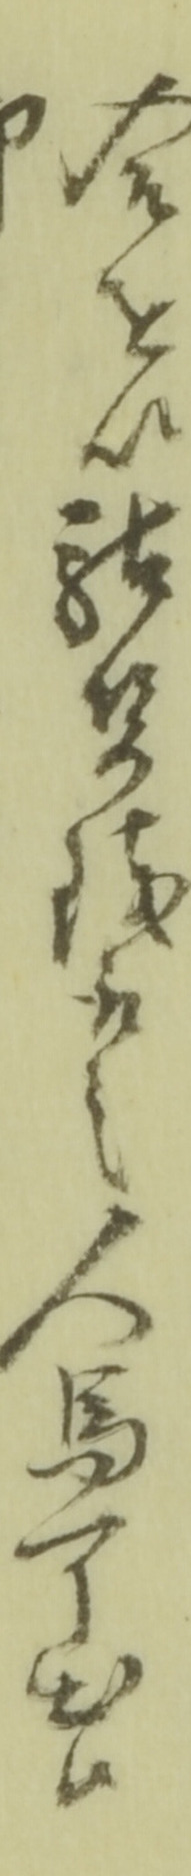合を以諸賃銭取之人馬可出候
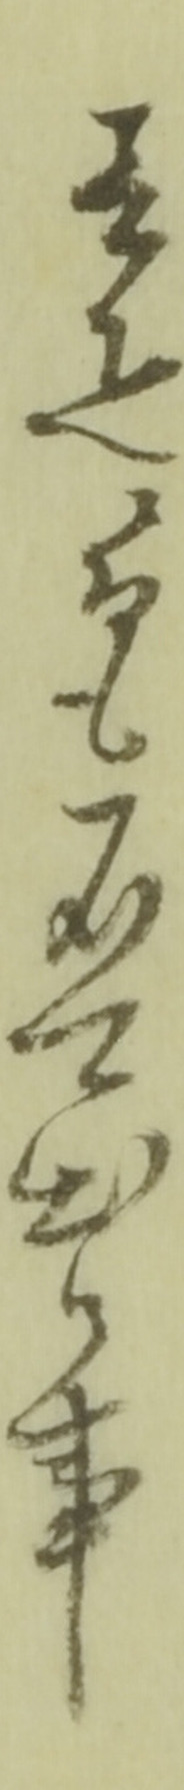壱疋尓而も不可出候事
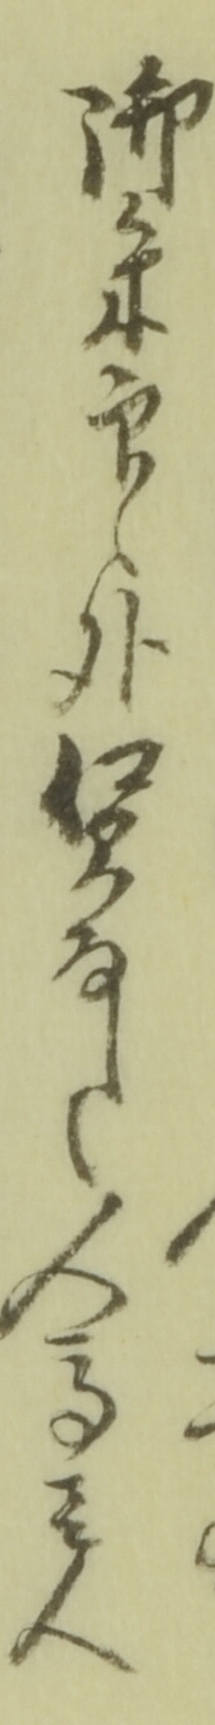御朱印之外賃なしの人馬壱人
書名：御公儀様御領主様御触書控
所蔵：伊那市立高遠町図書館・合同会社AMANE
